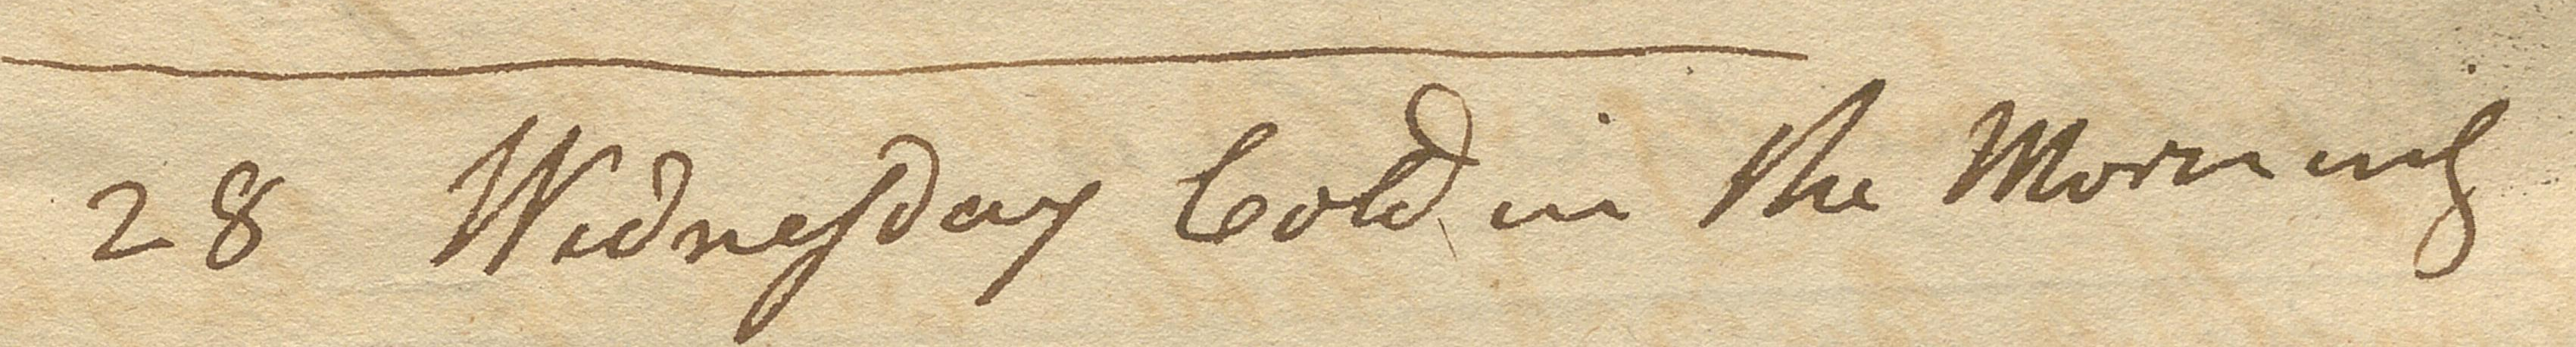28 Wednesday Cold in the Morning
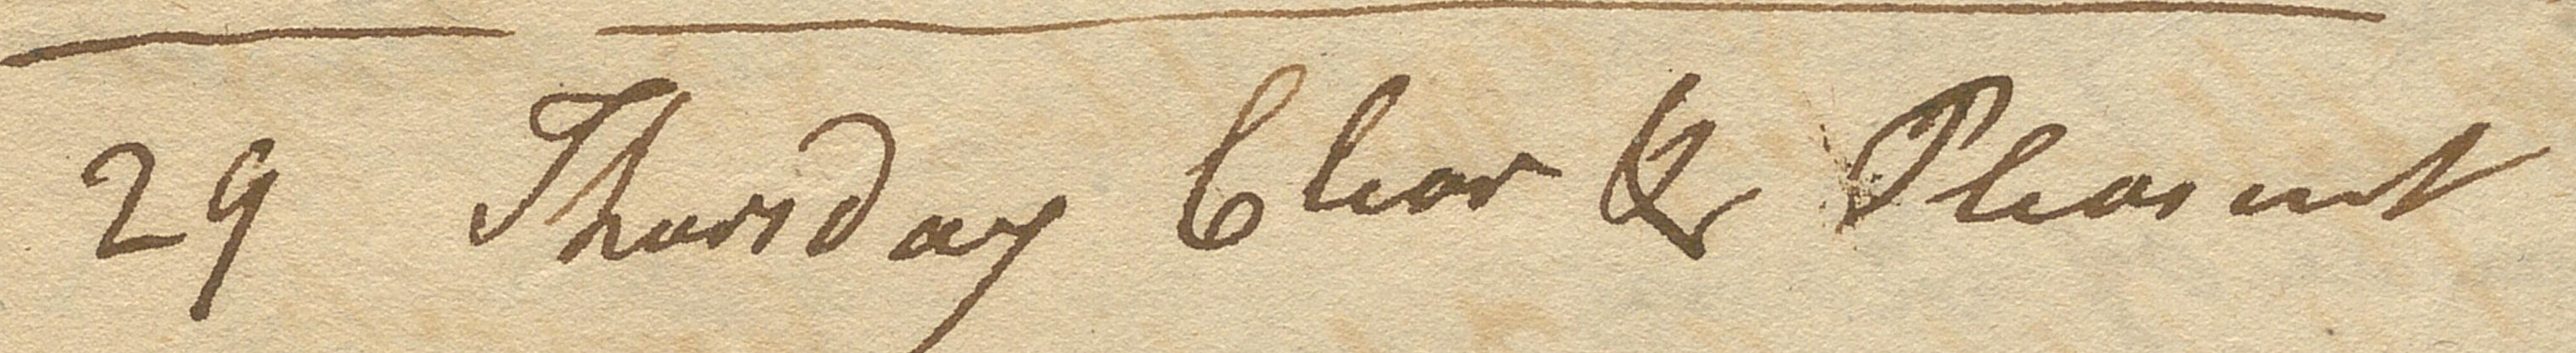29 Thursday Clear & Pleasent
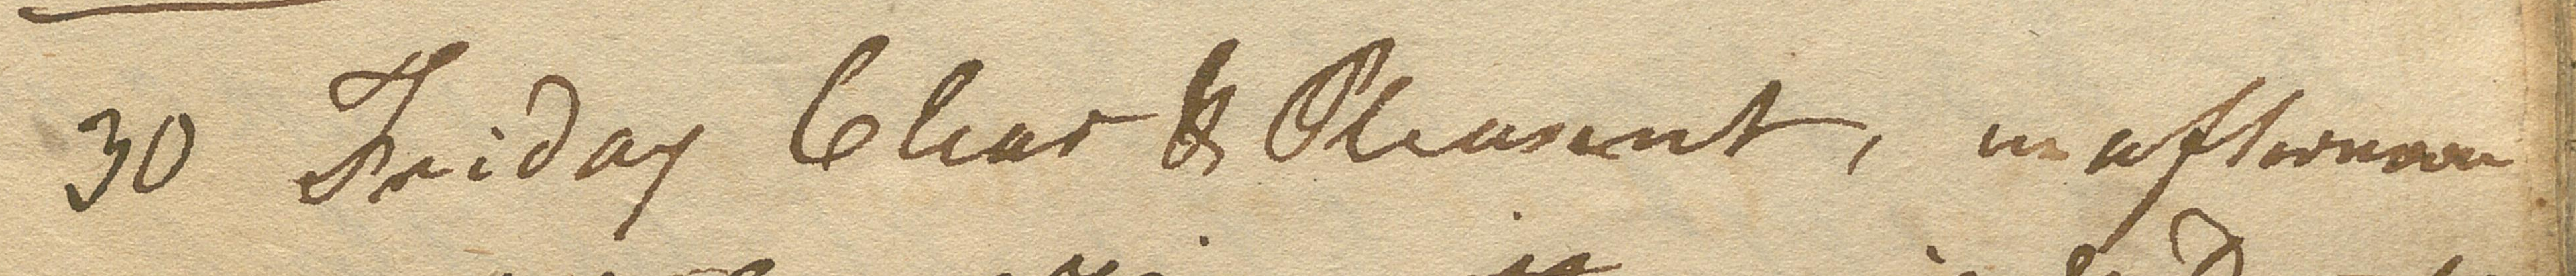30 Friday Clear & Pleasent, in afternoon
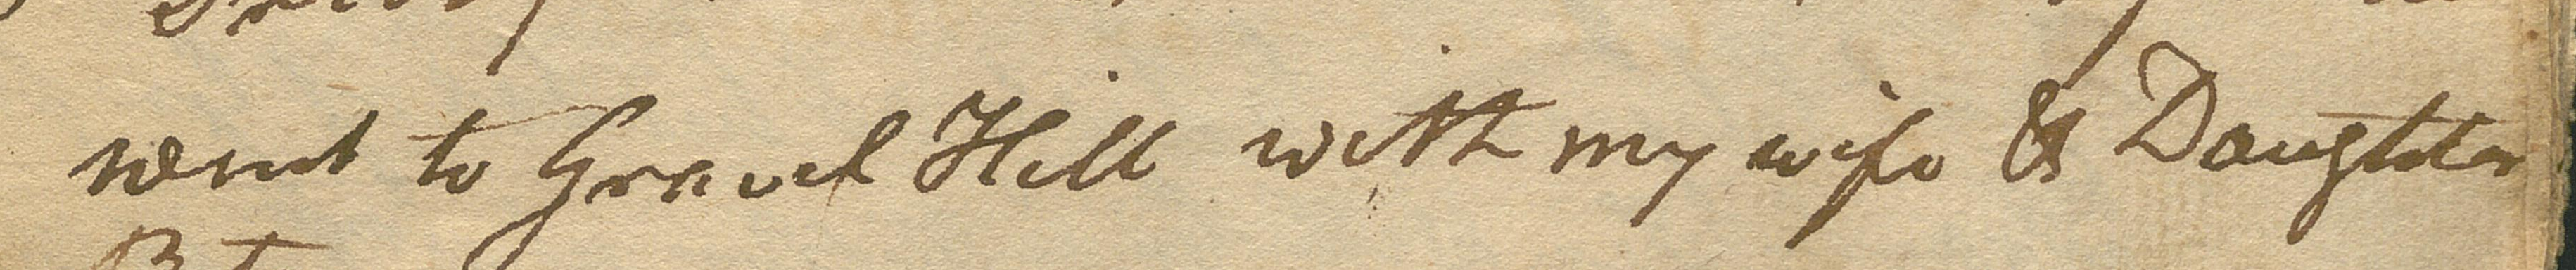went to Gravel Hell with my wife & Daughater
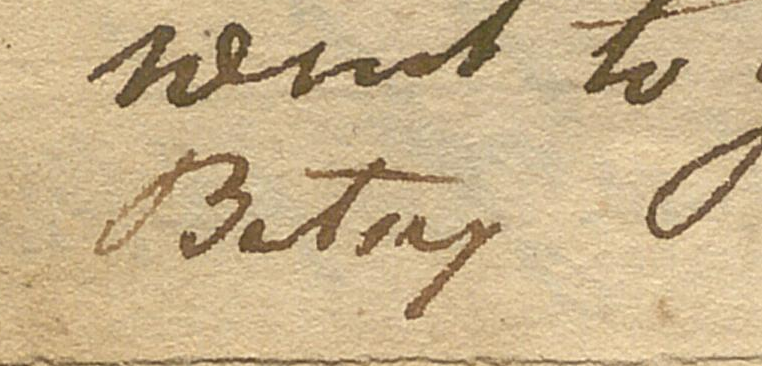Betsy
